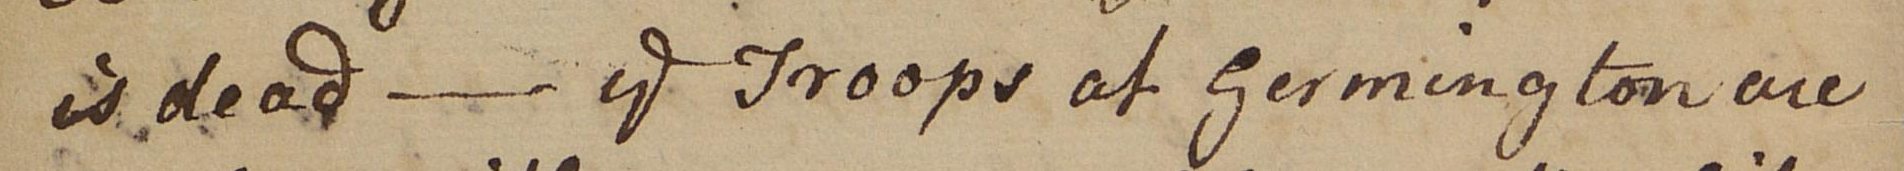is dead- y^e Troops at Germington are
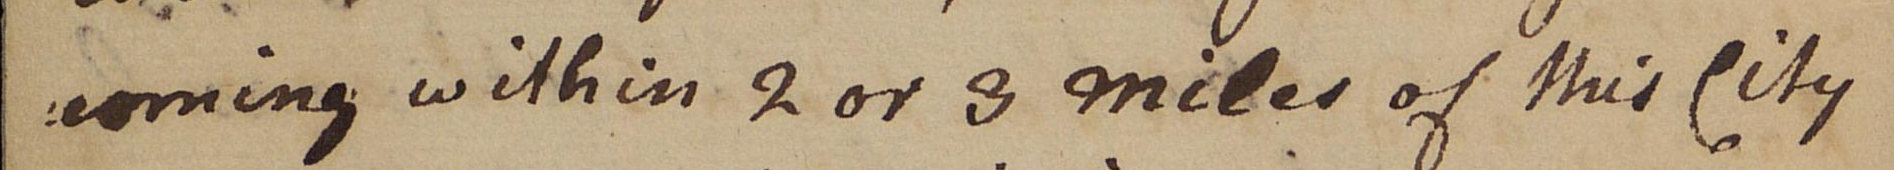coming within 2 or 3 miles of this City
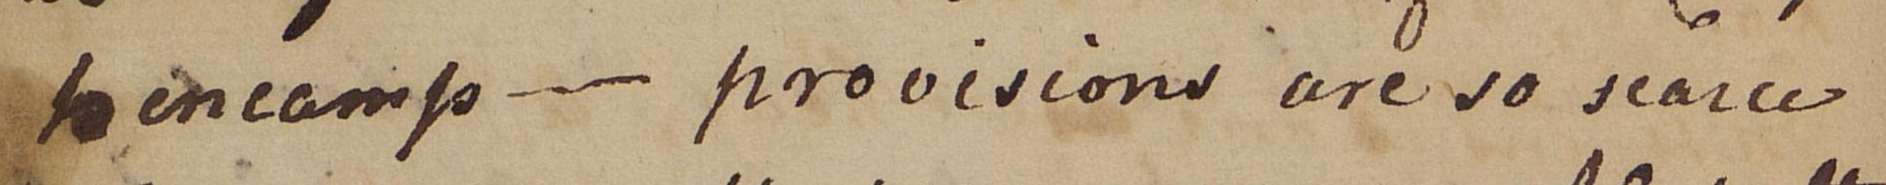to encamp- provisions are so scarce
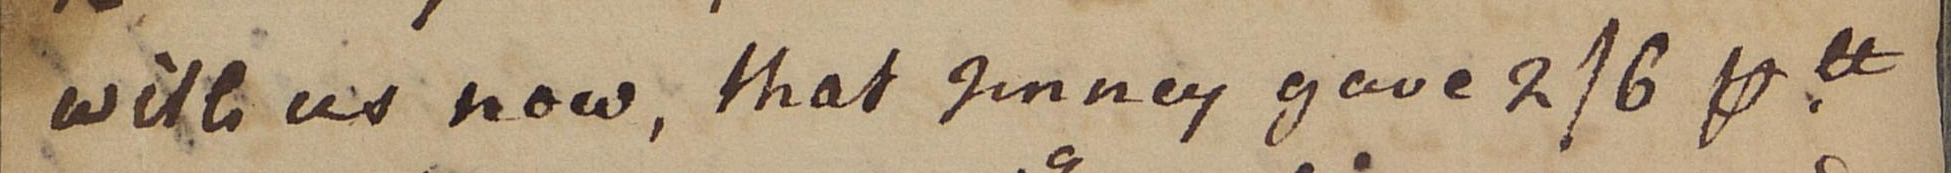with us now, that Jenney gave 2s6 & ^lb.
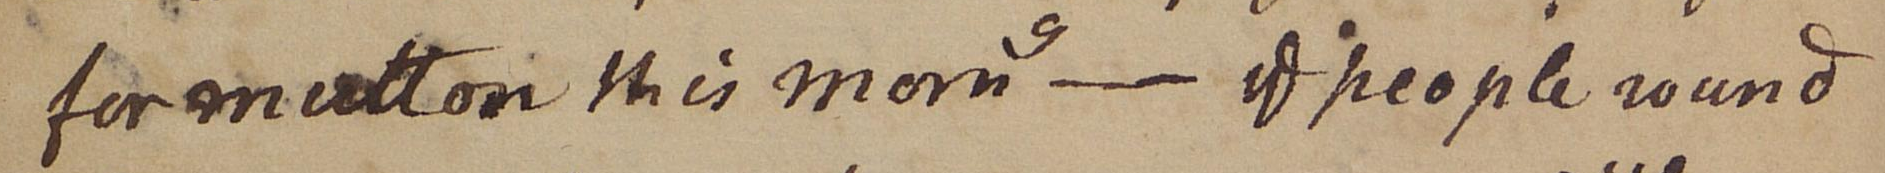for mutton this morn^g- y^e people round
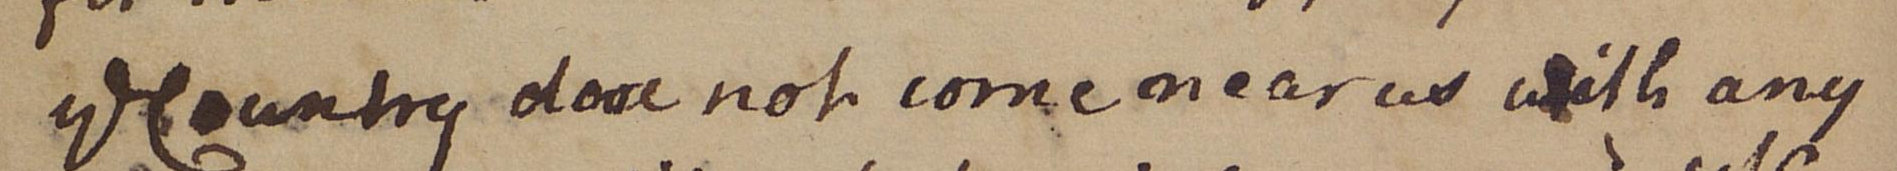y^e Country dare not come near us with any
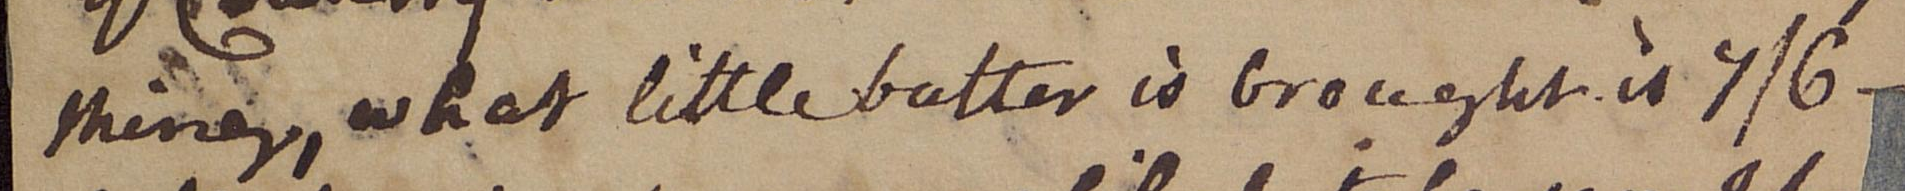thing, what little butter is brought is 7s6-
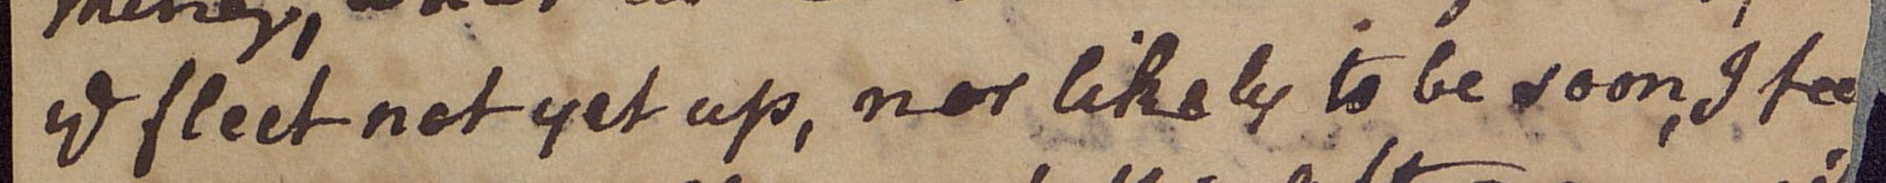y^e fleet net yet up, nor likely to be soon, I fea
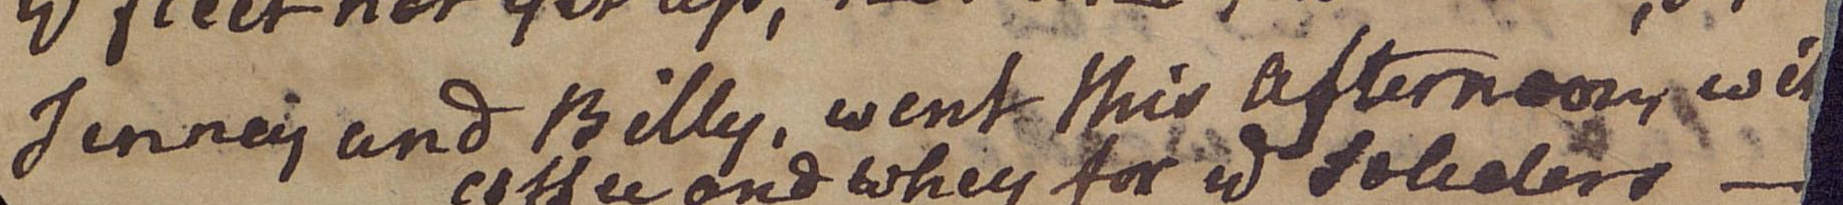Jenney and Billy, went this Afternoon wi
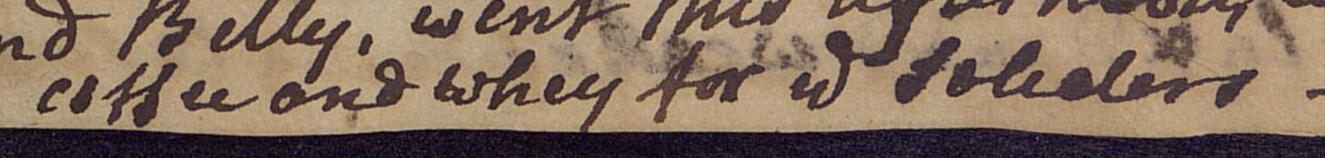coffee and whey for y^e soliders
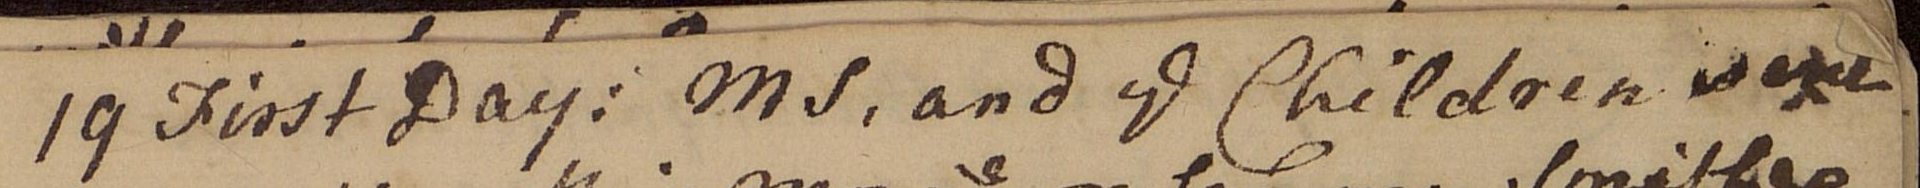19 First Day: MS, and y^e Children sent
